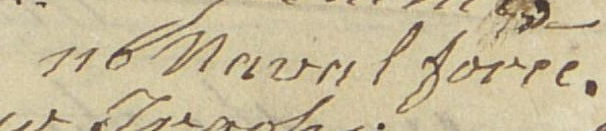no naval force
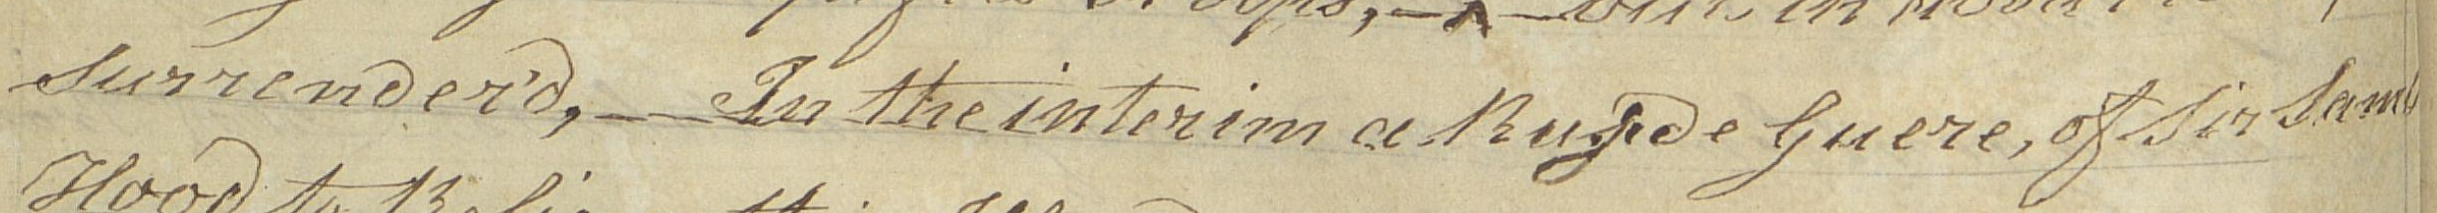surrender'd, In the interim a Ruside Guere, of Sir Sam^l
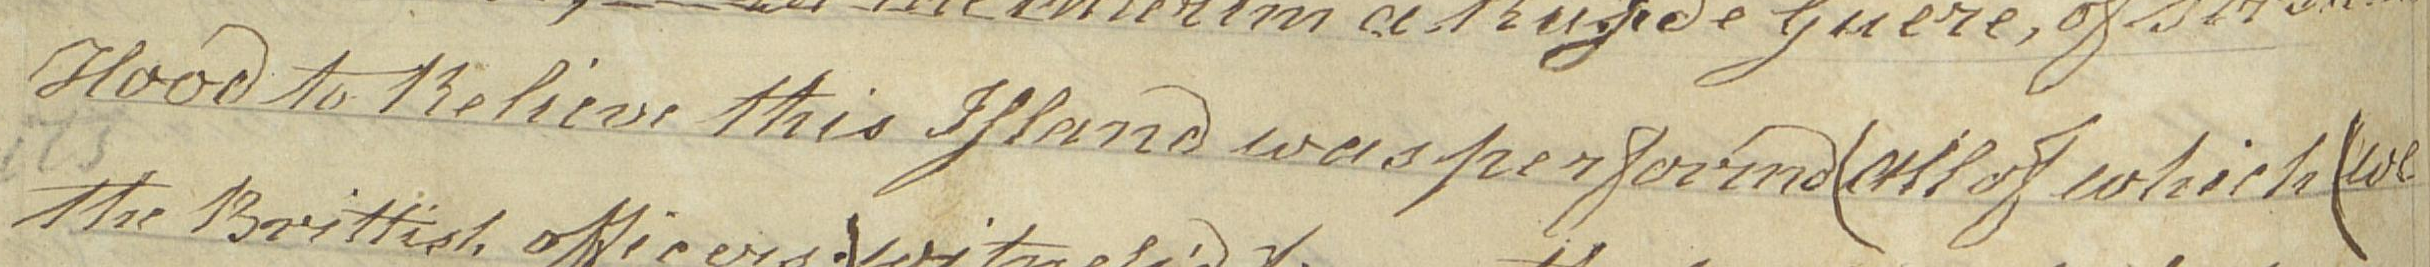Hood to Relieve this Island was performd (all of which (we
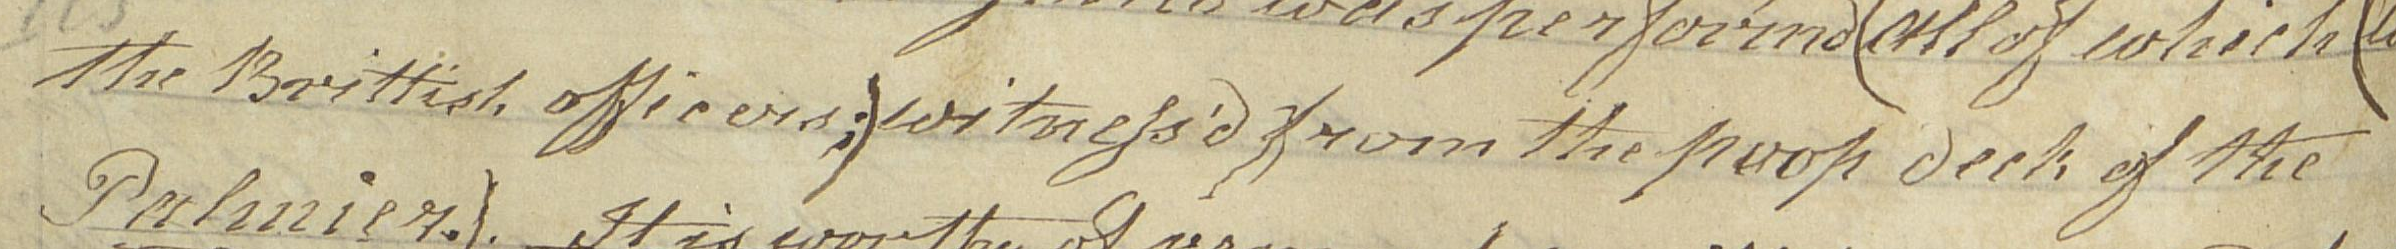the Brittish officers;) witness'd from the poop deck of the
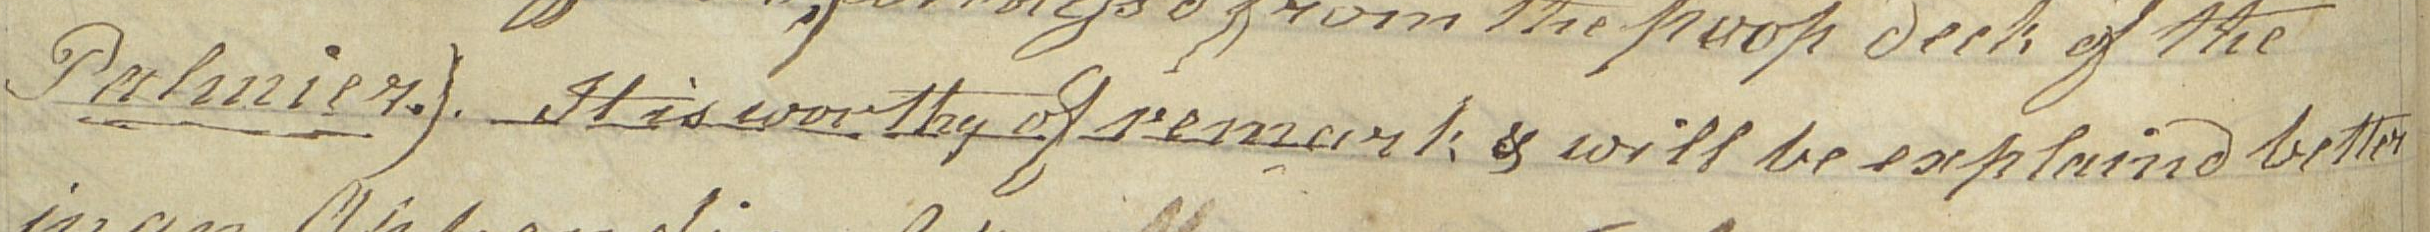Palmier.) His worthy of remark & will be explaind better
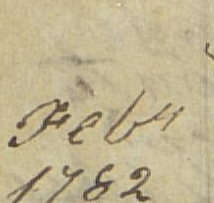Feb^y
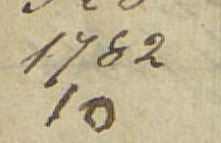1782
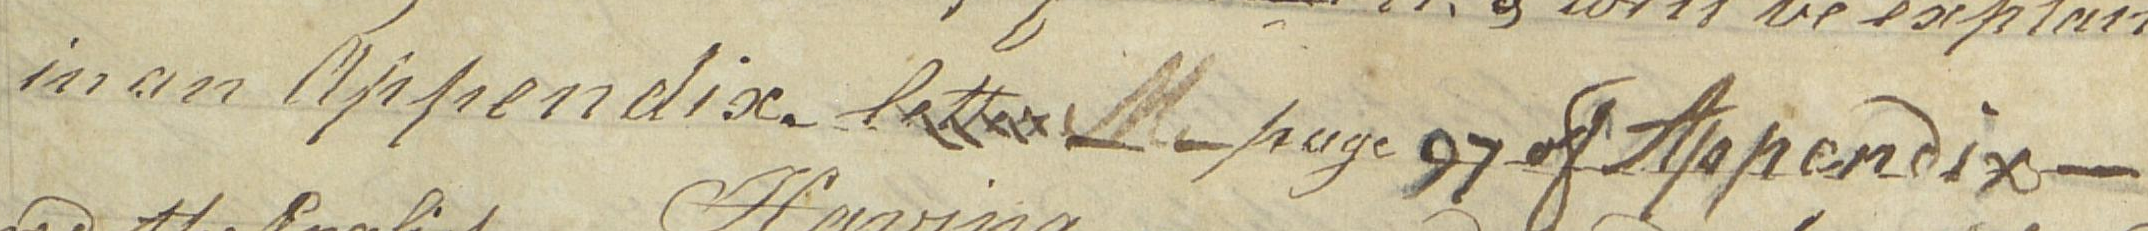in an Appendix latter M page 97 of Appendix
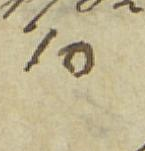10
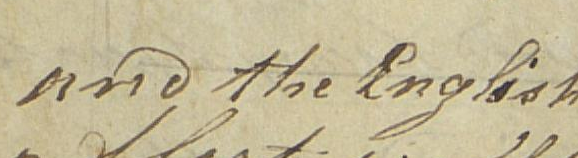and the English
